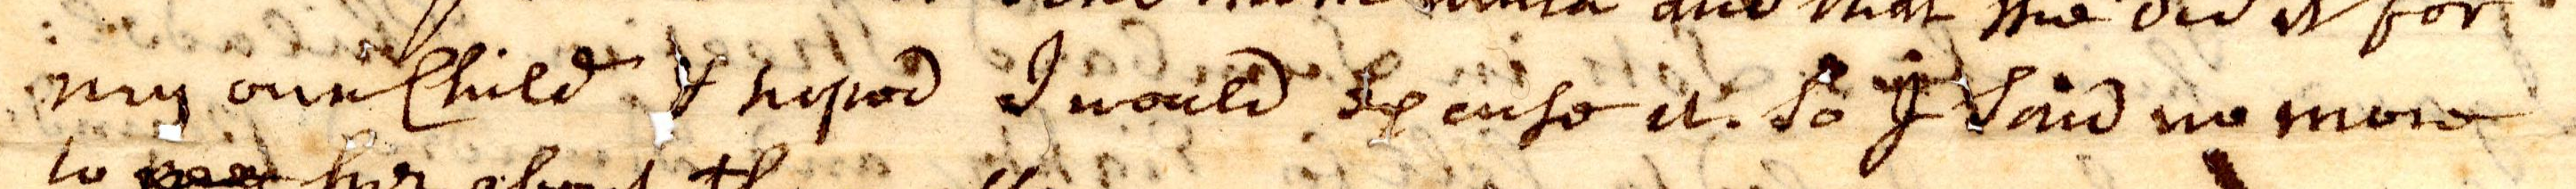my own Child & hoped I would excuse it. So I said no more
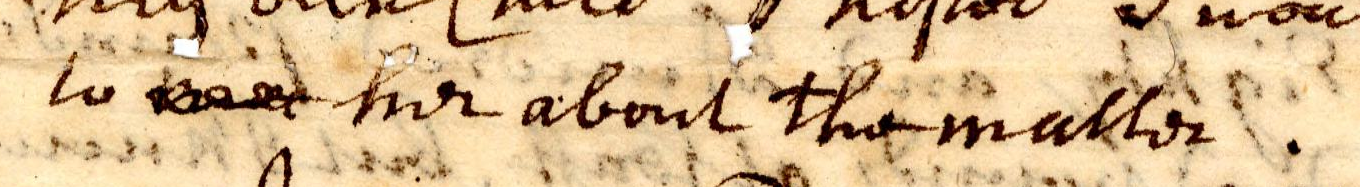to [___] her about the matter.
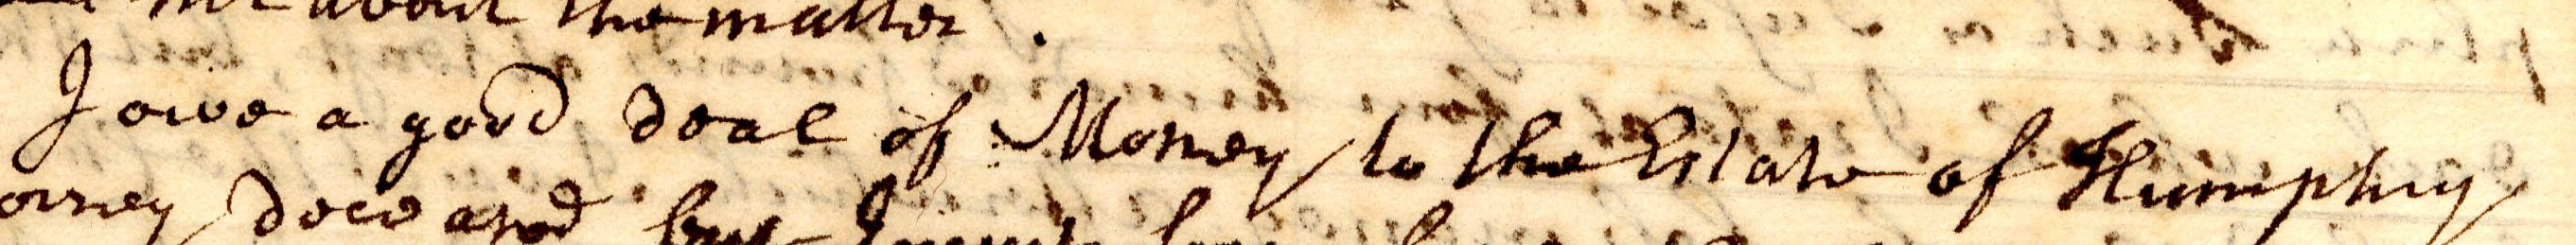I owe a good deal of Money to the Estate of Humphry
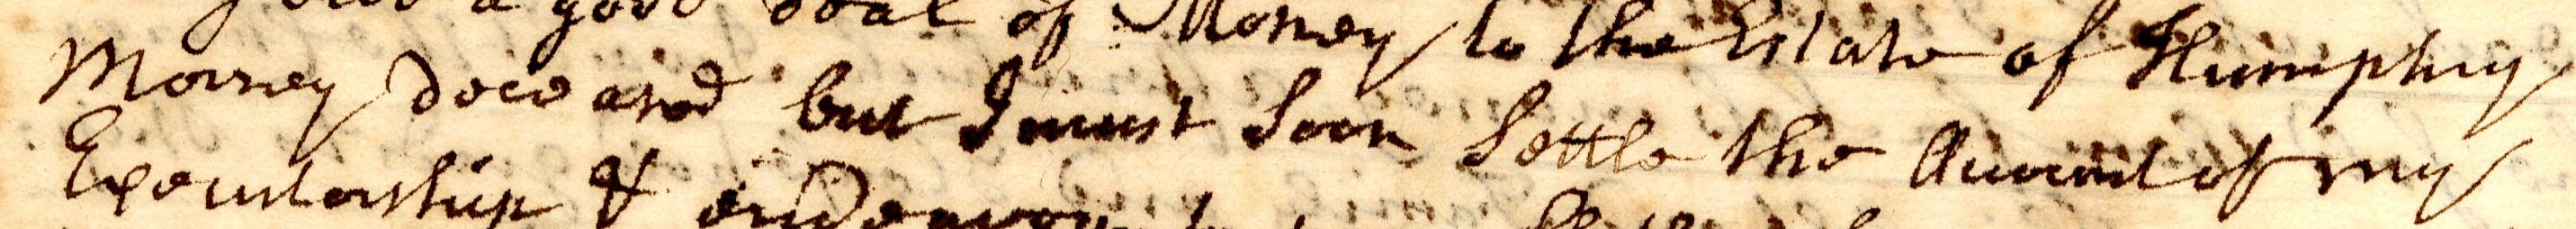Money [dues] and but I must soon settle the account of my
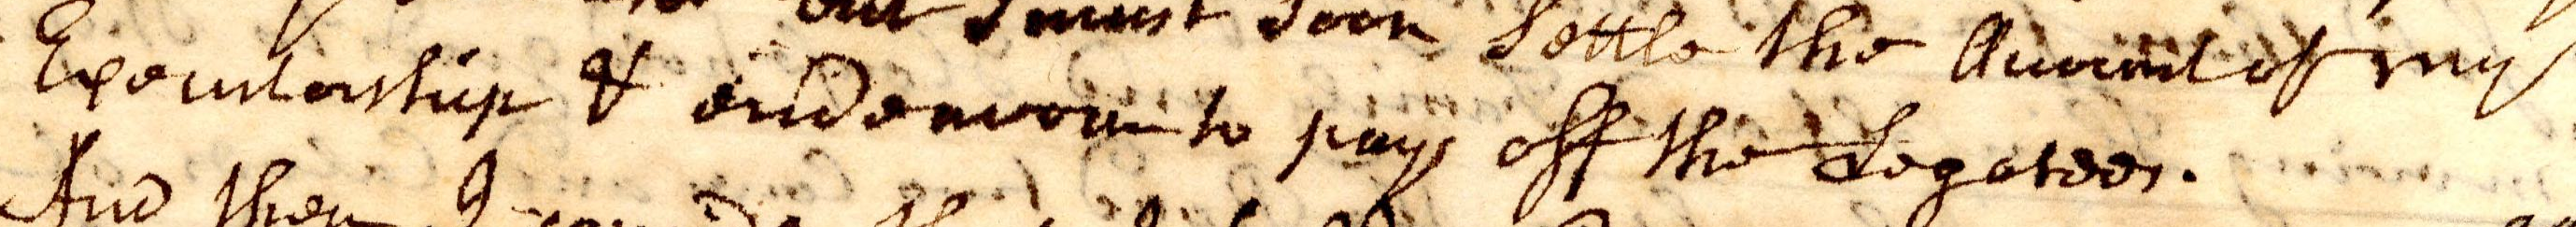Executorship & endeavour to pay off the Legateer.
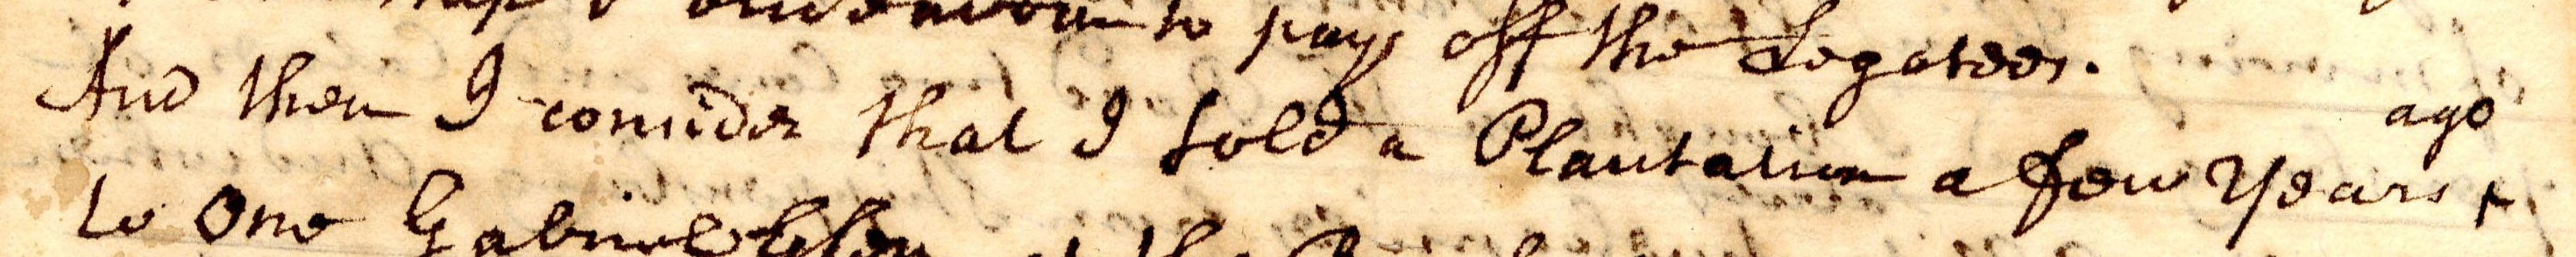And then I consider that I sold a Plantation a few Years ^
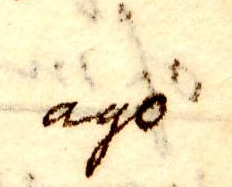ago
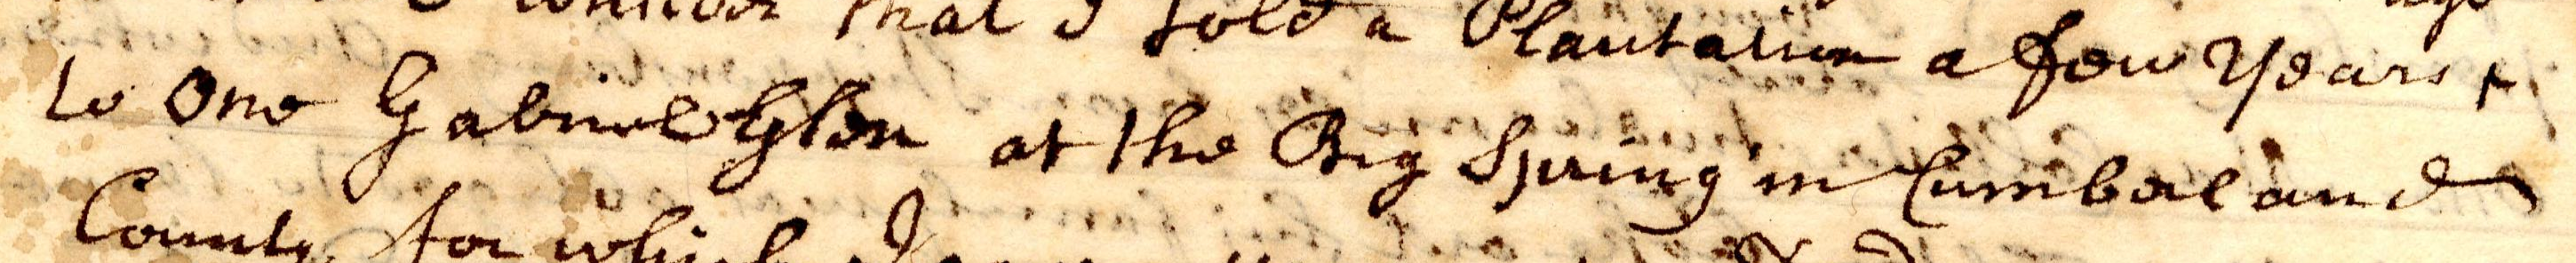to one Gabriel Glen at the Big Spring in Cumberland
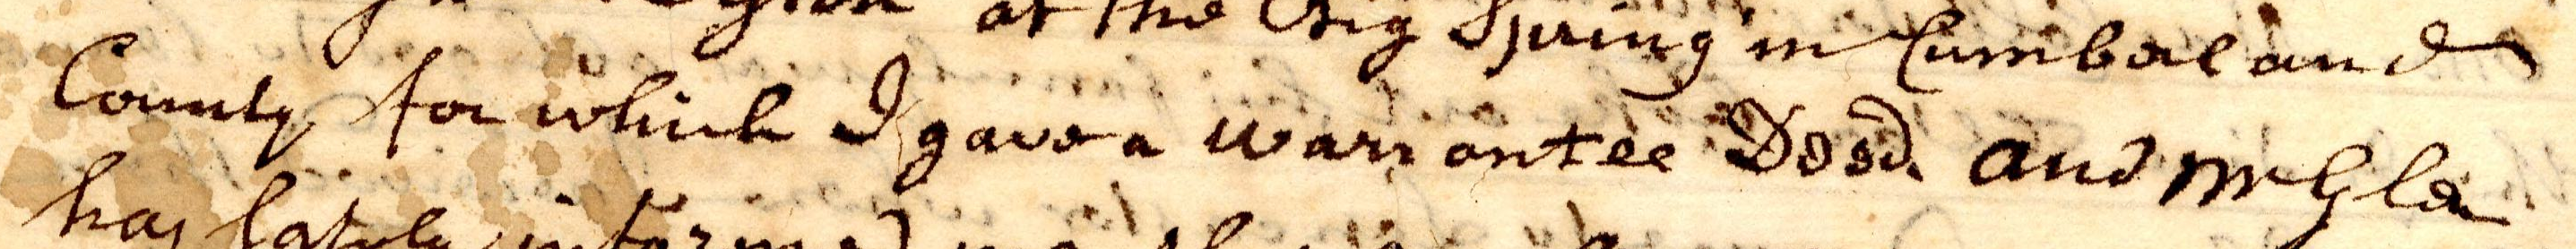County for which I gave a warrantee Deed and M^r Glen
